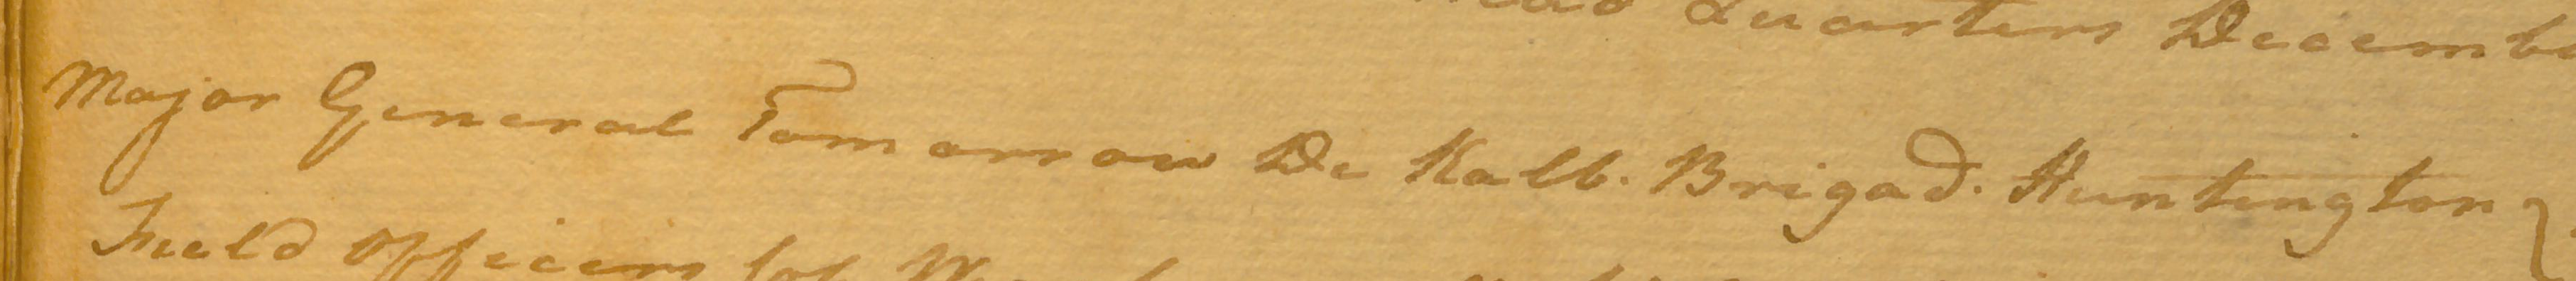Major General Tomorrow De Kalb. Brigad. Huntington
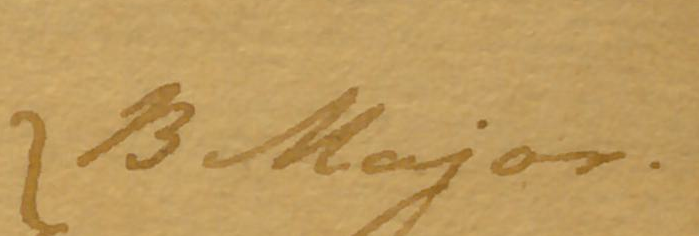B Major.
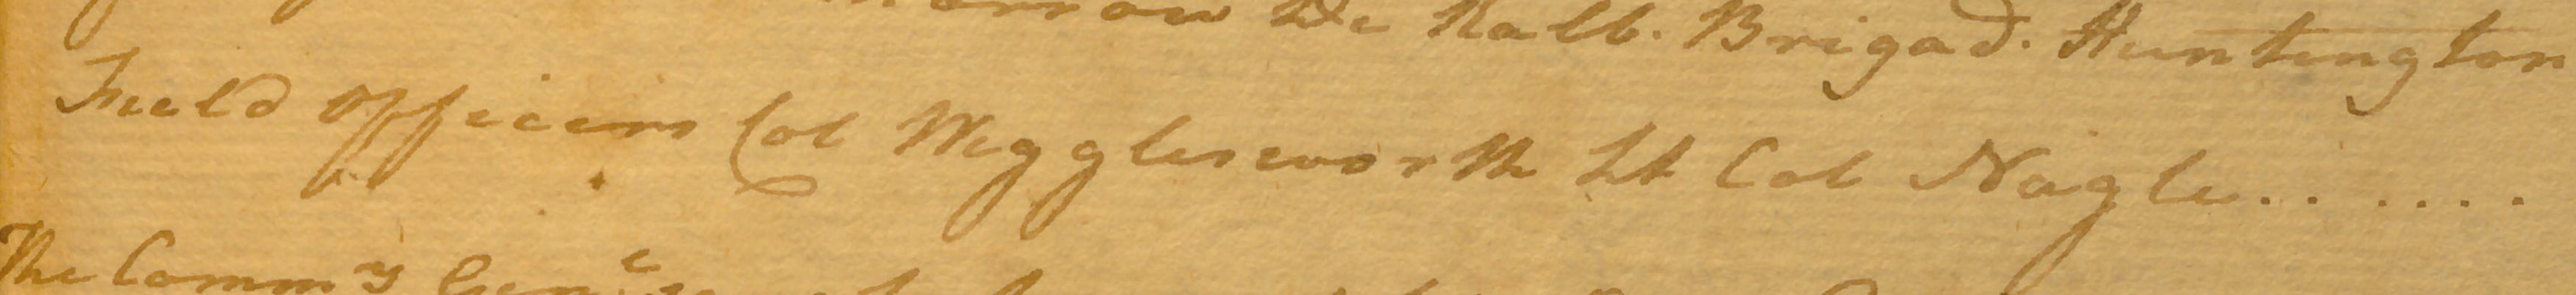Field Officers Col Wigglesworth Lt Col Nagle......
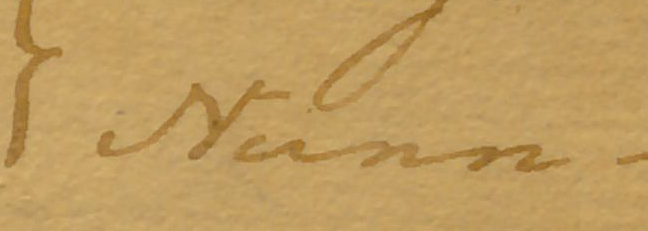Nunn
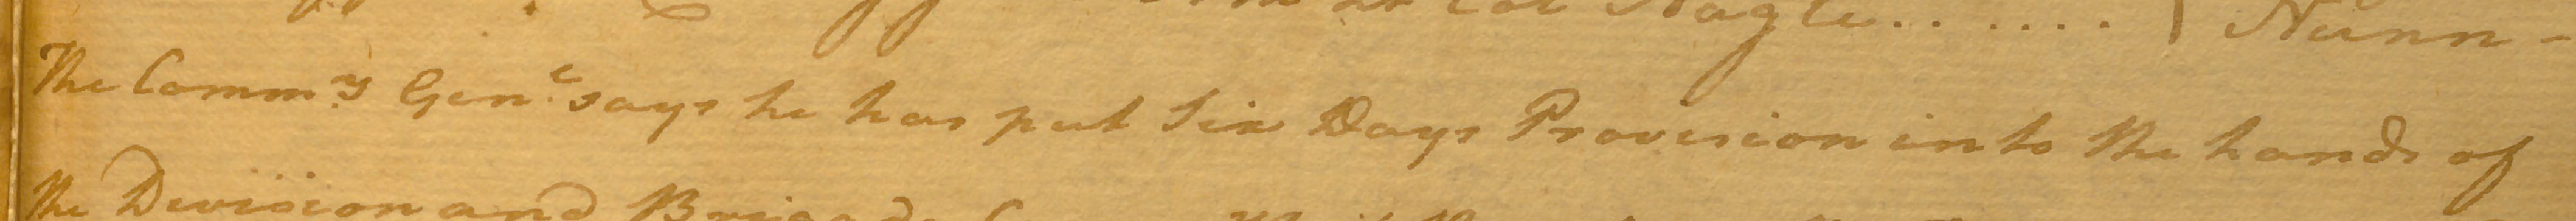The Comm^y. Gen^l. says he has put six Days provisions into the hands of
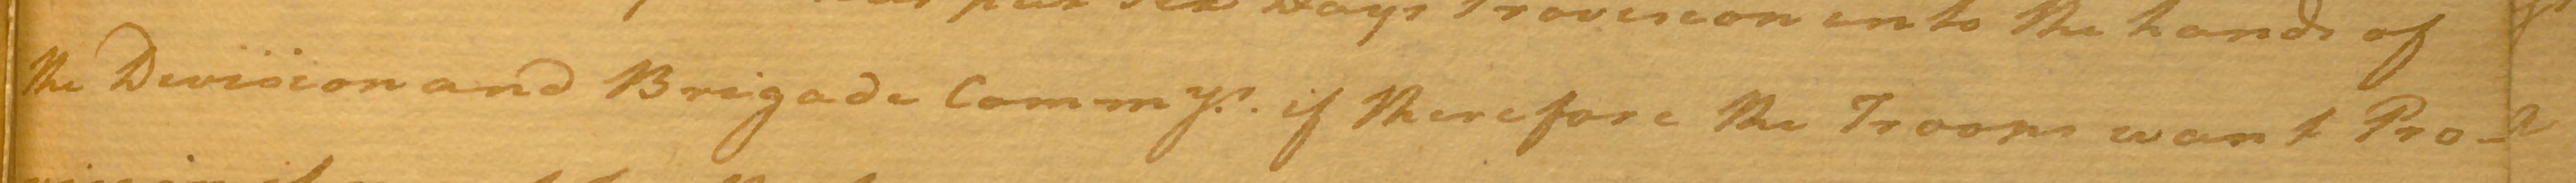the Division and Brigade Comm^ys. if therefore the Troops want Pro-
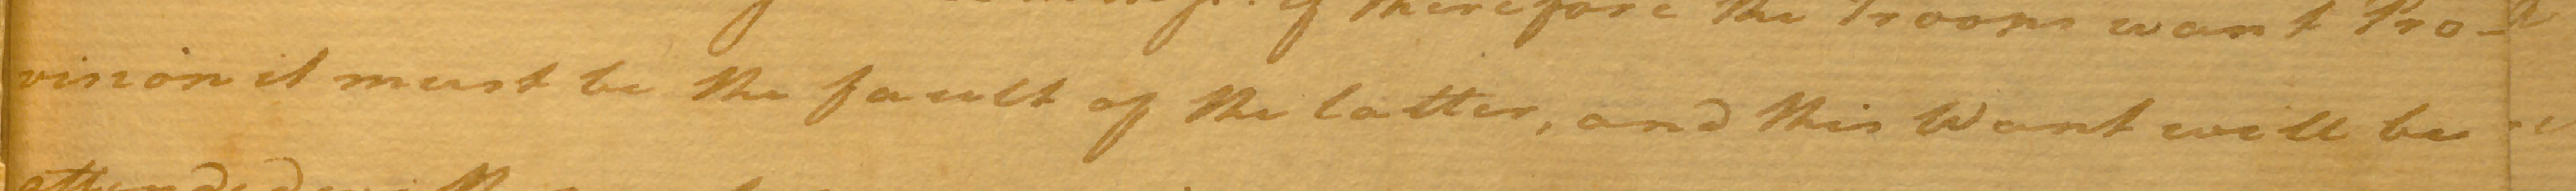vision it must be the fault of the latter, and this Want will be
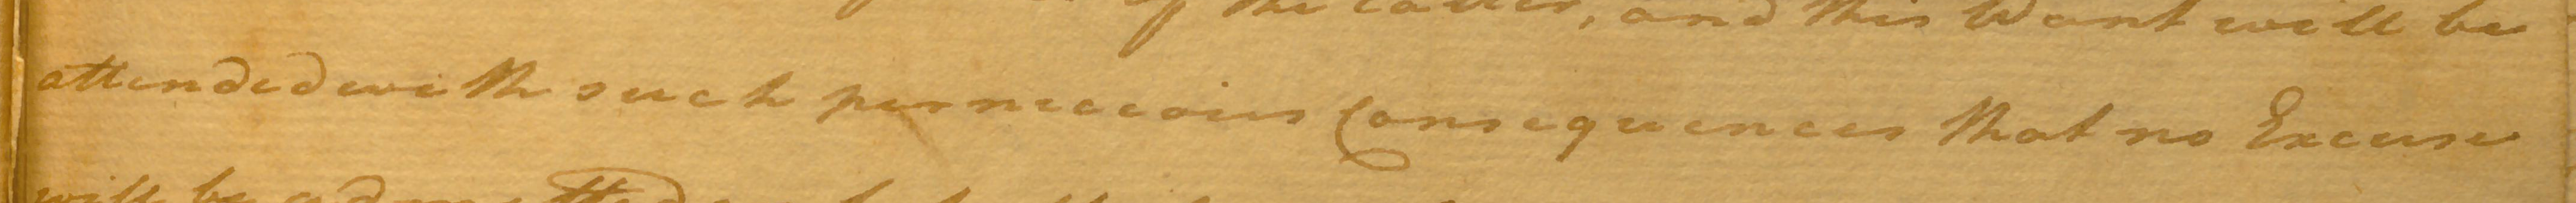attended with such pernicious Consequences that no Excuse
